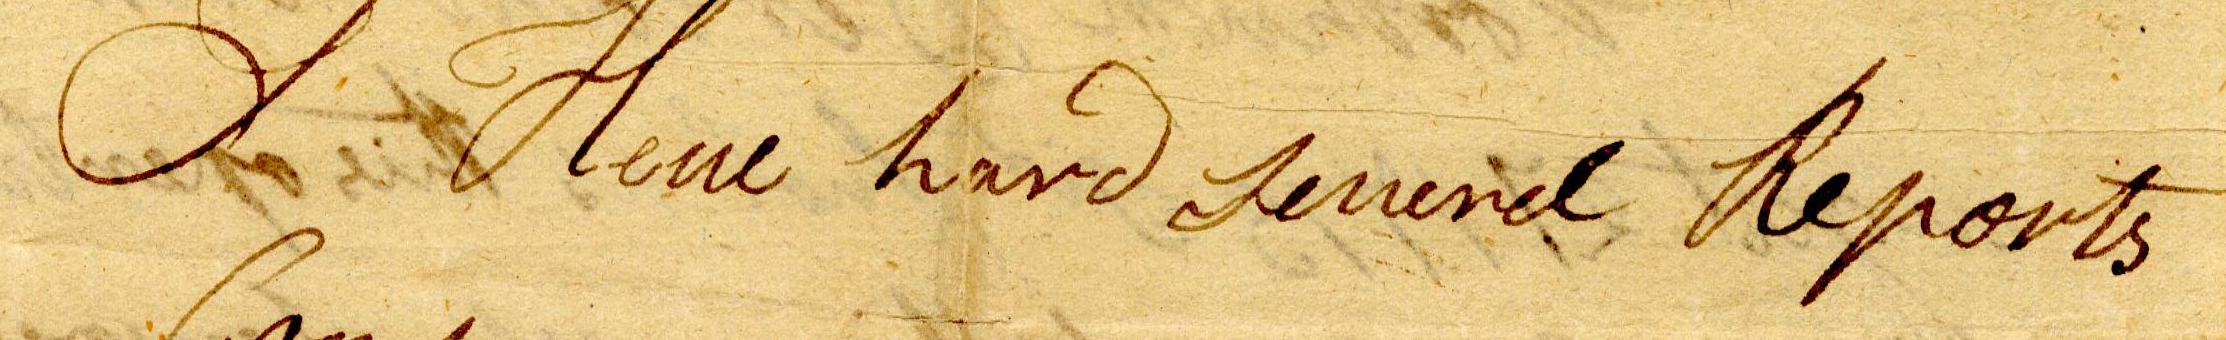I Have hard severel Reports
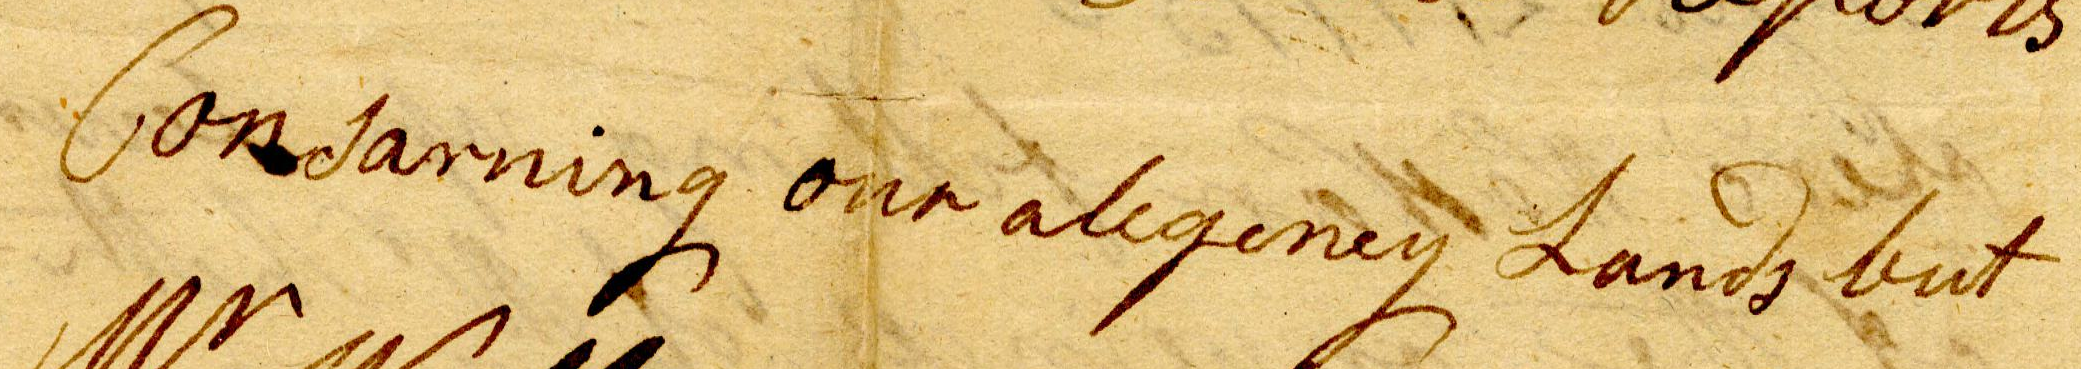consarning our alegeney Lands but
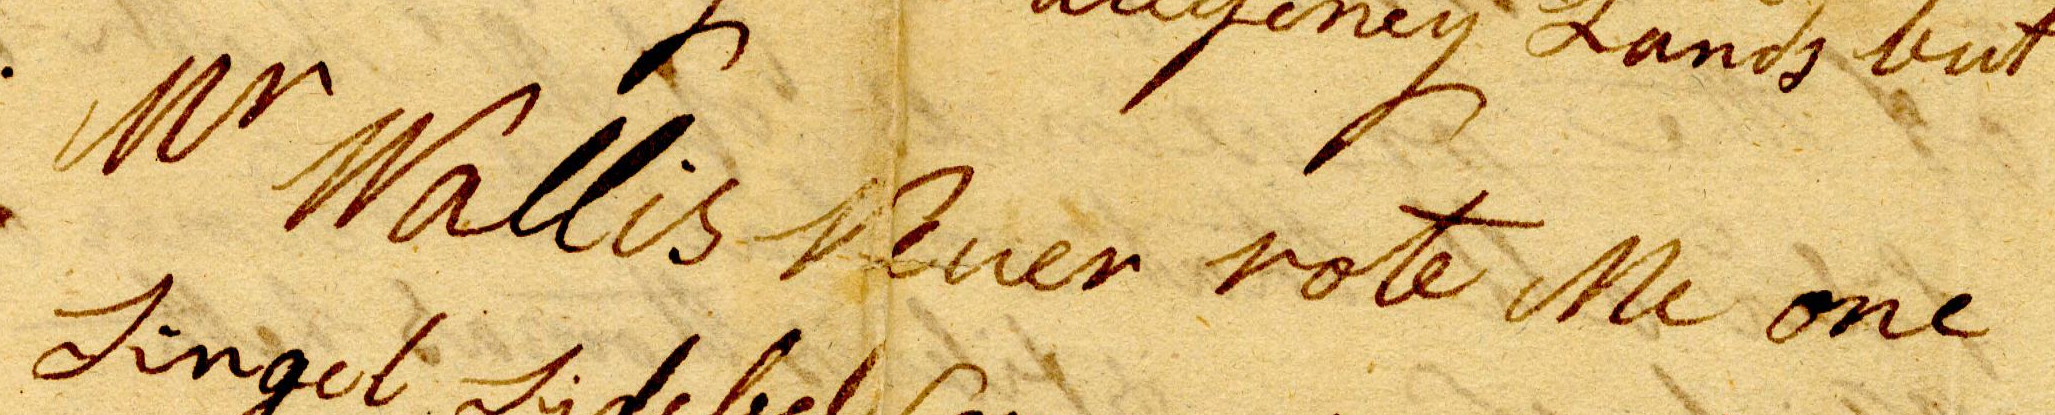M^r Wallis Never rote Me one
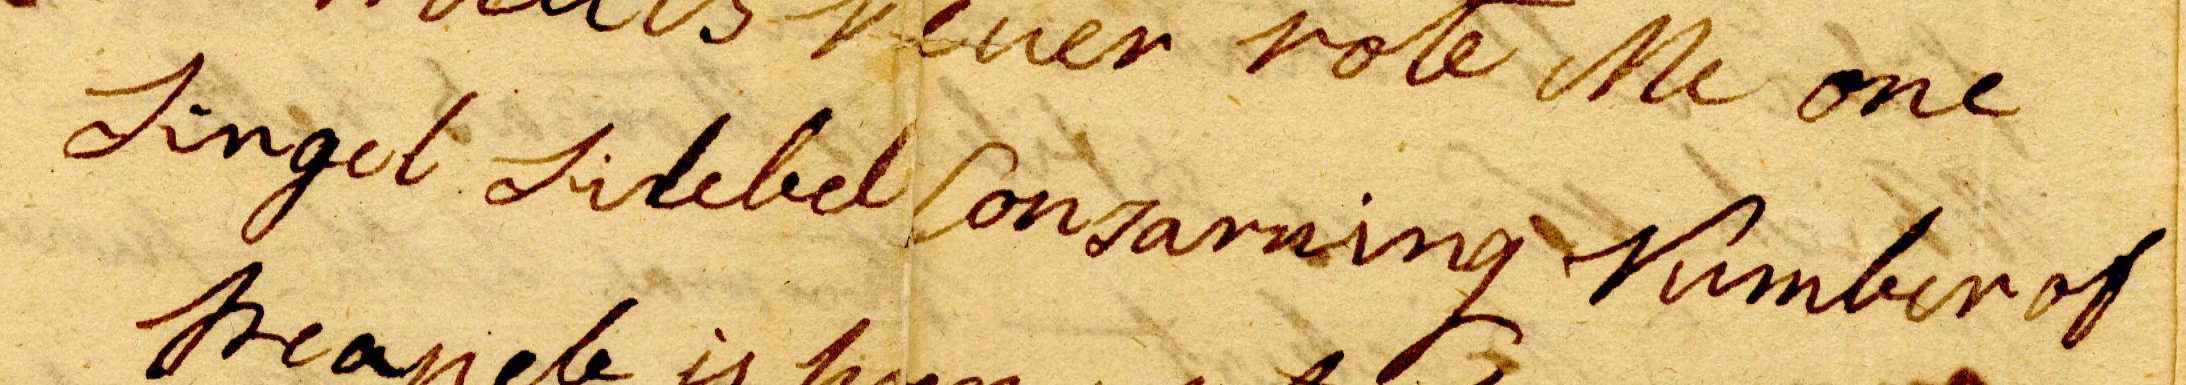Singel silibel consarning Number of
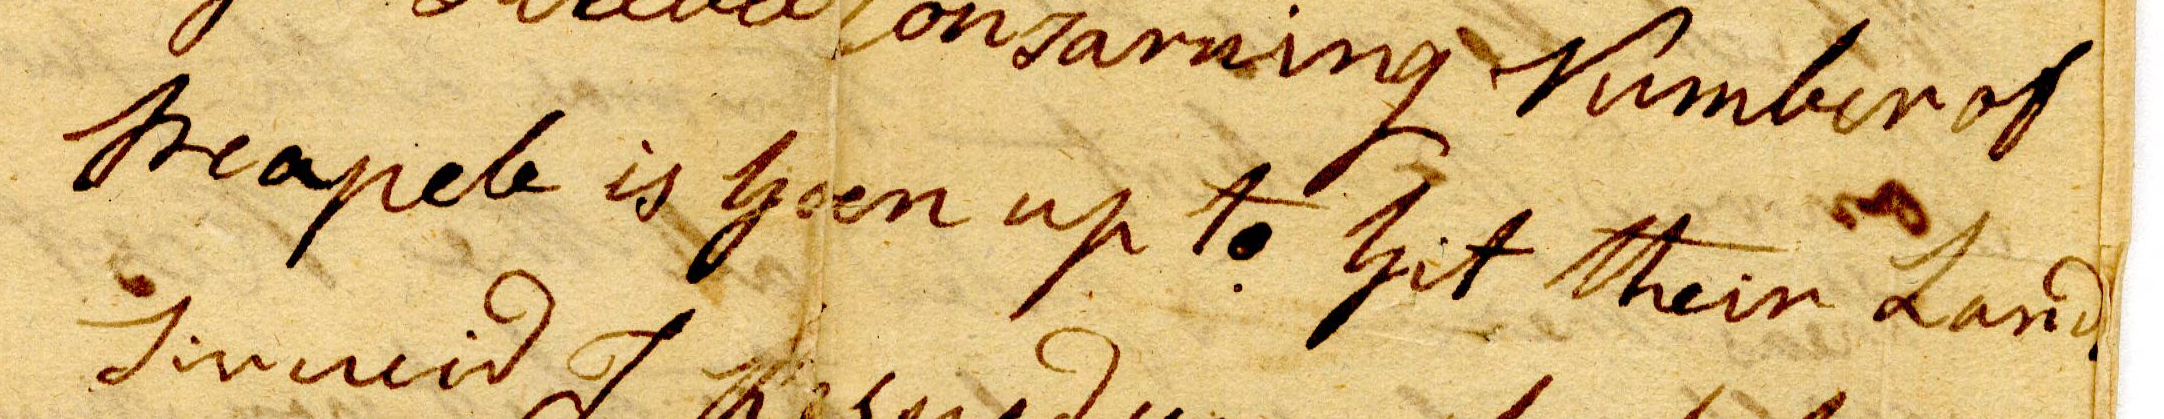peapele is goen up to git their Land
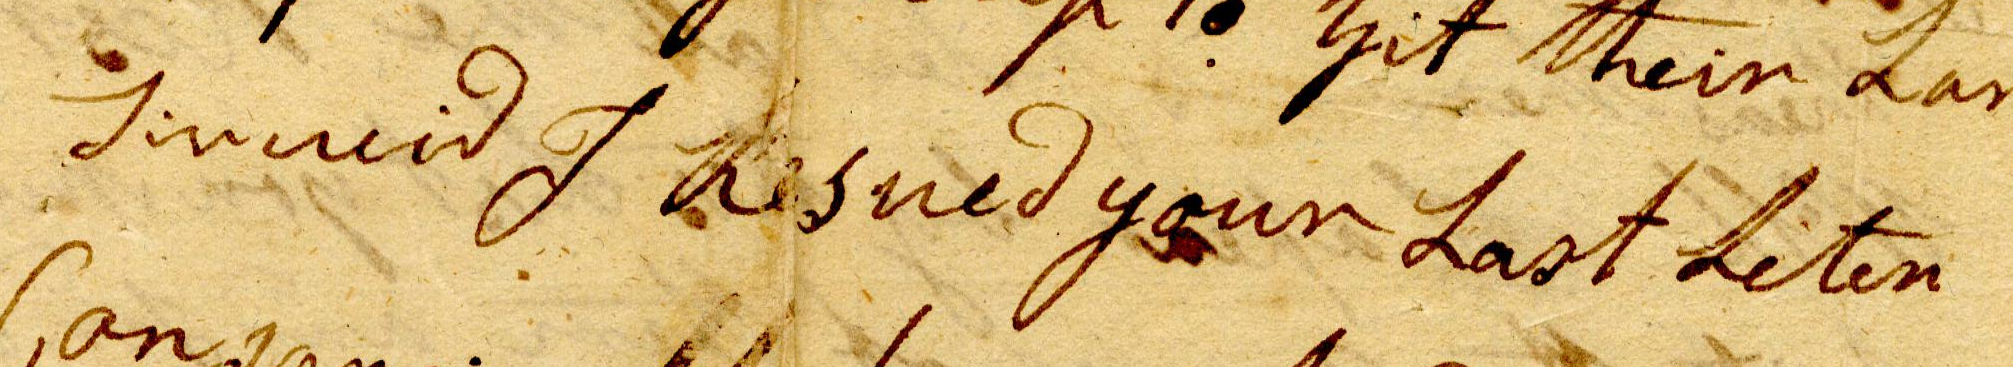Sinceid I resived your Last leter
